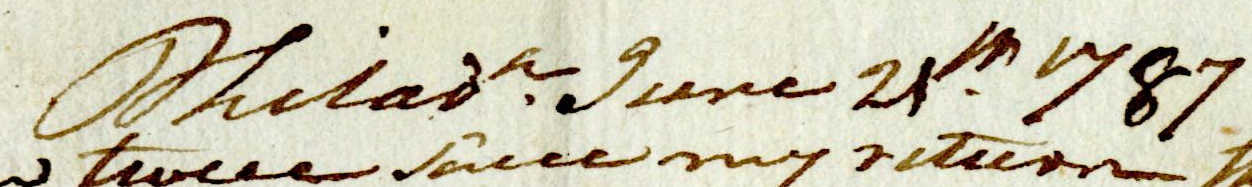Philad^a. June 21^st. 1787
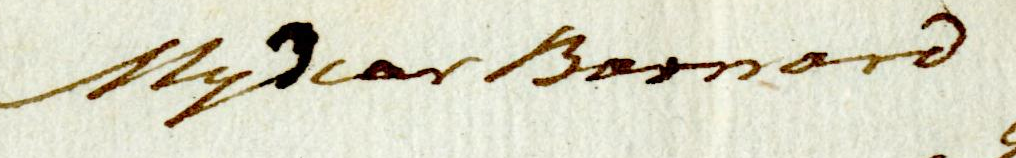My Dear Barnard
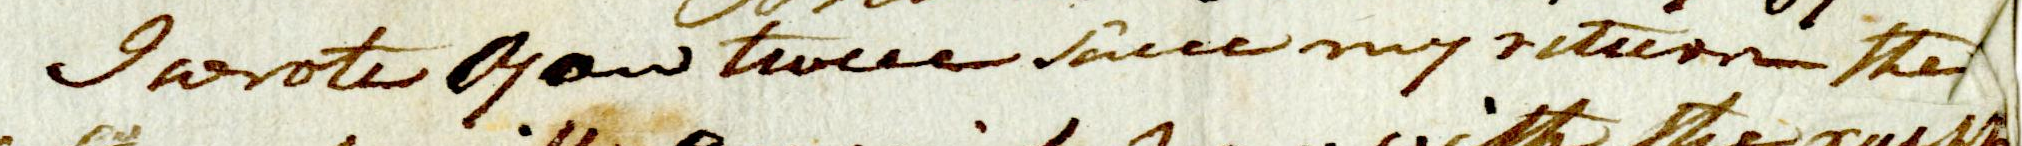I wrote you twice since my return the
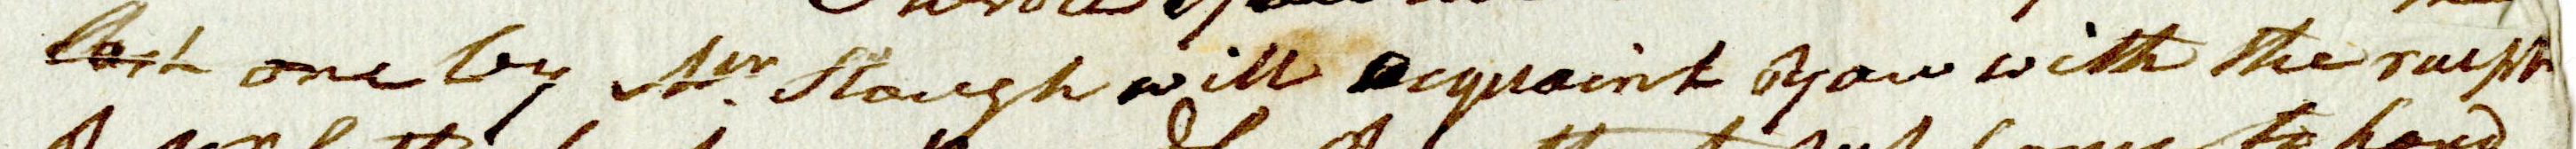last one by M^r. Slough will acquaint you with the recipt
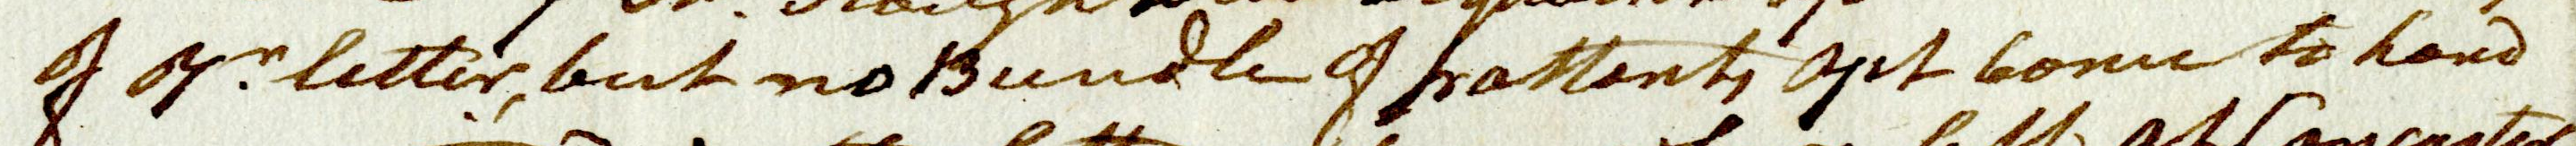of y^r. letter, but no Bundle of pattents yet Come to hand
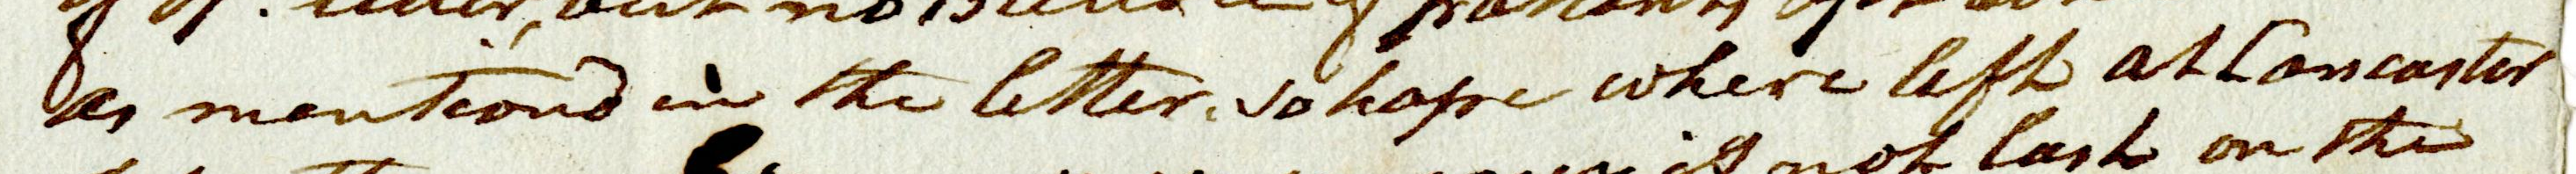as mentiond in the letter so hope where left at Lancaster
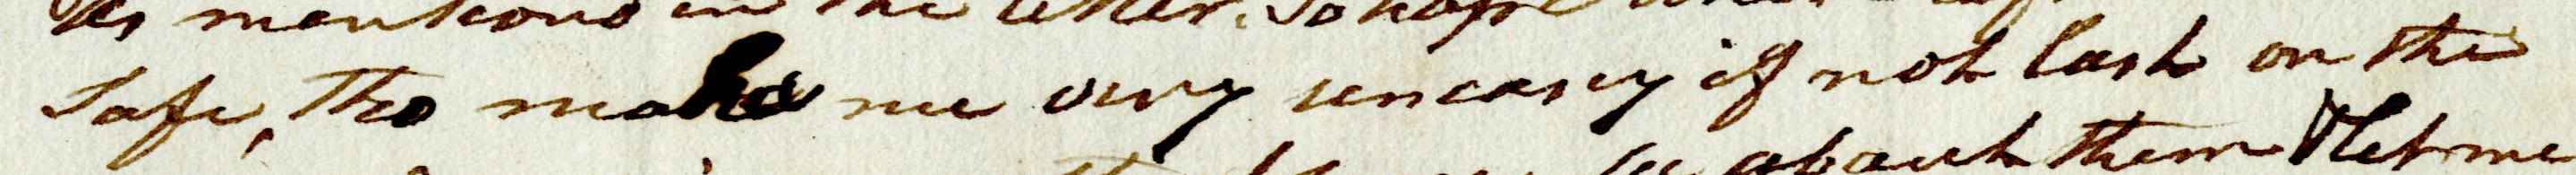Safe, tho make me very uneasy if not Cash on the
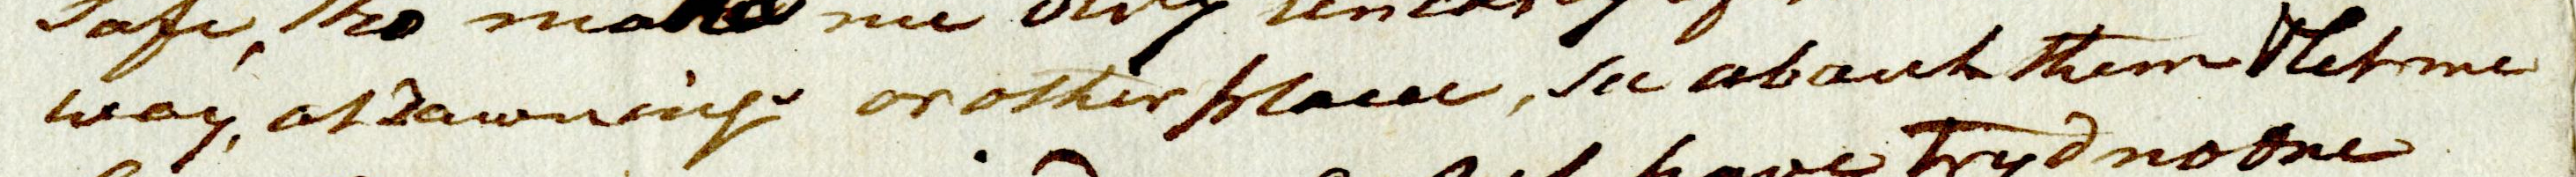way, at dawnings or other place, see about them & let me
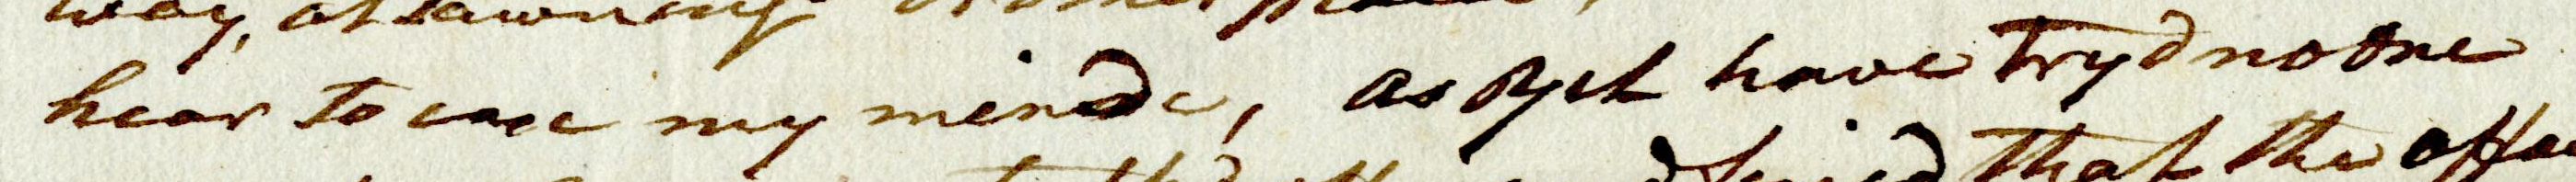hear to ease my minde, as yet have tryd no one
